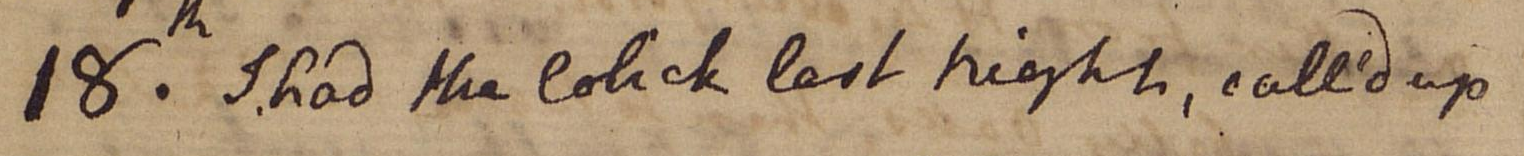18^th. I had the Colick last night, call'd up
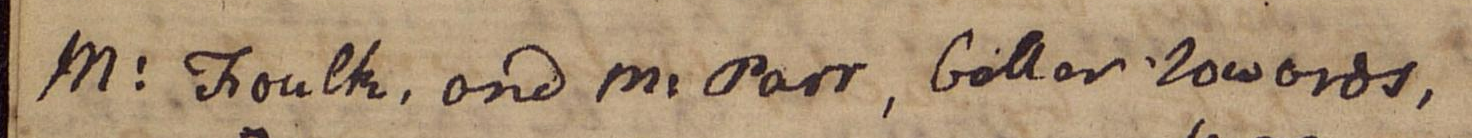M: Foulk, and M: Parr, [bollar] towards,
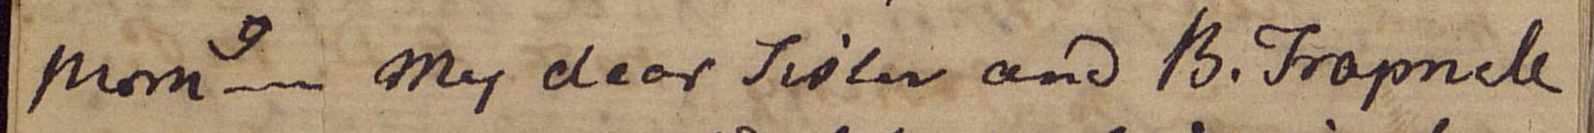Morn^g- My dear Sister and B. Trapnell
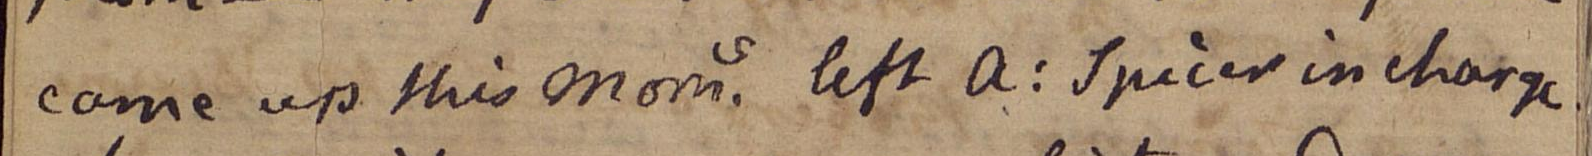came up this morn^g. left A: spicer in charge
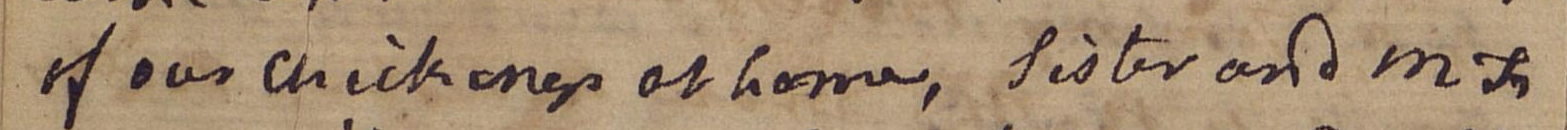of our Chickenes at home, Sister and MS.
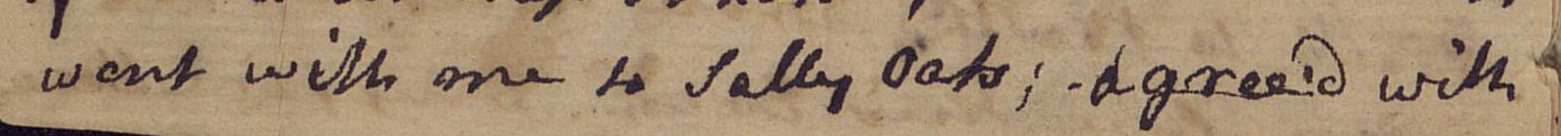went with me to Sally Oats; agree'd with
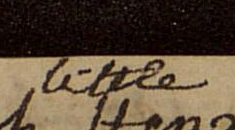little
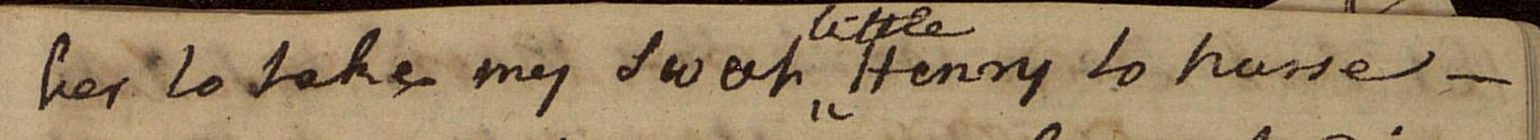her to take my sweet ^ Henry to Nurse -
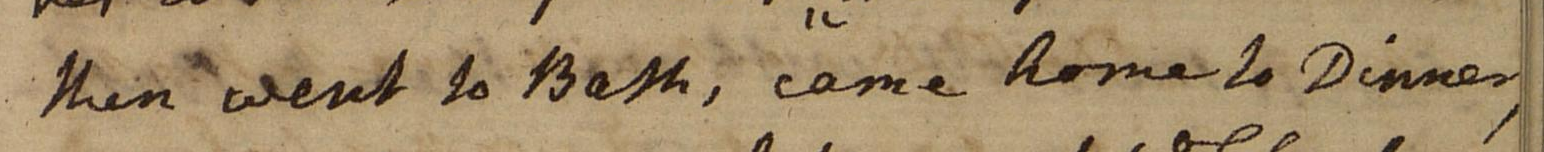then went to Bath, came home to Dinner,
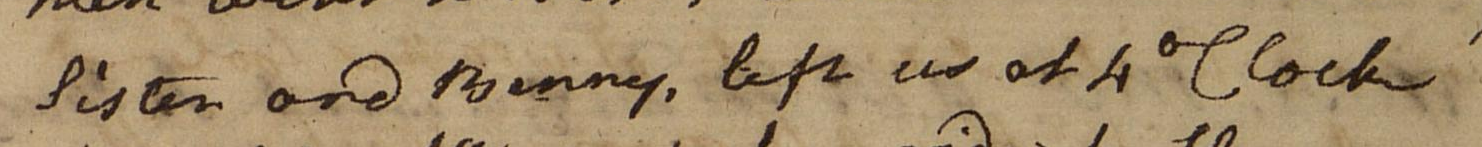Sister and Benny, left us at 4 ^o Clock
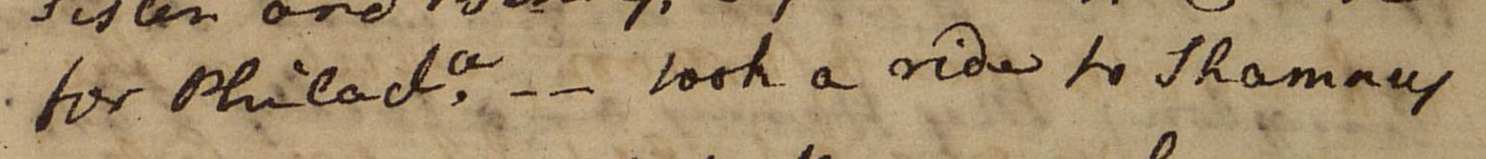for Philad^a.-- took a ride to Shamney
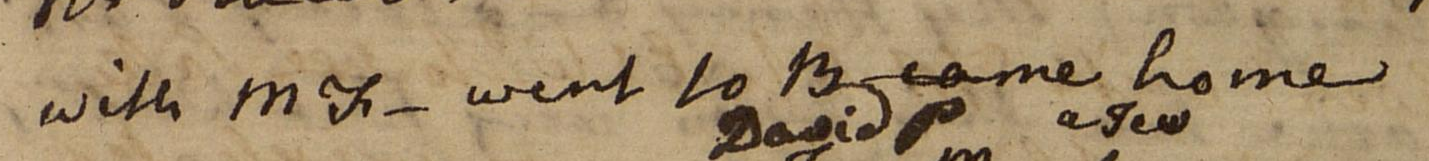with MF- went to B came home
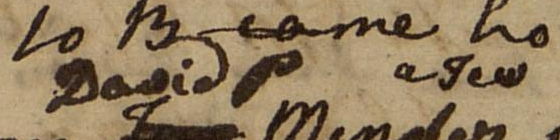David P a Few
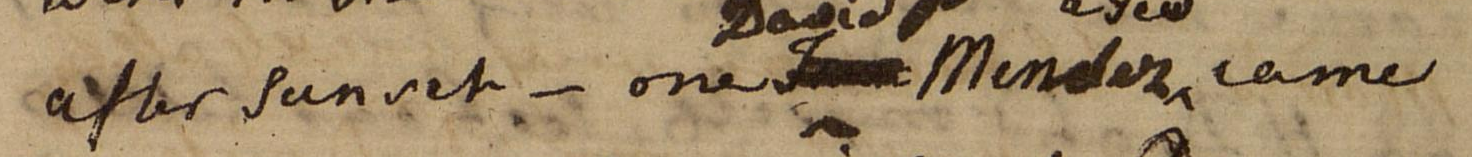after sunset - one [___] ^ Mendez ^ came
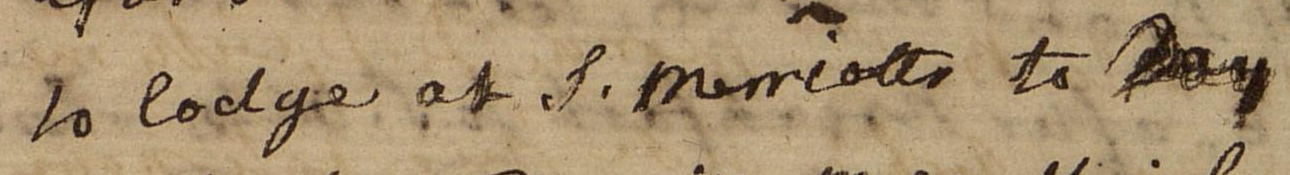to lodge at S. Merriotts to Day
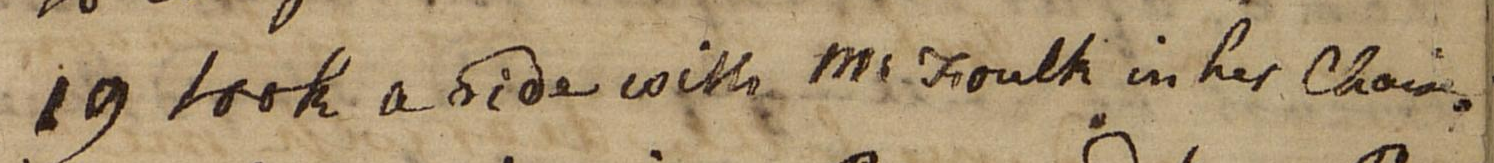19 took a ride with M: Foulk in her Chai[se]
